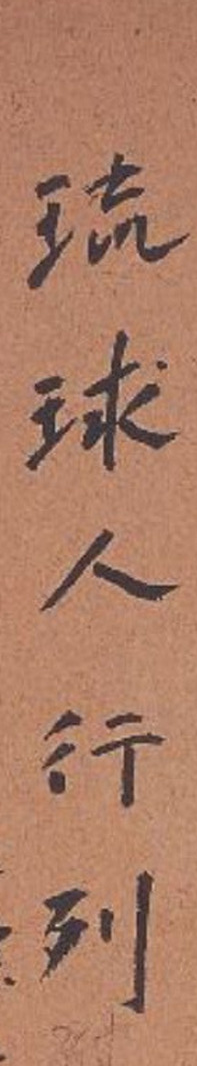琉球人行列
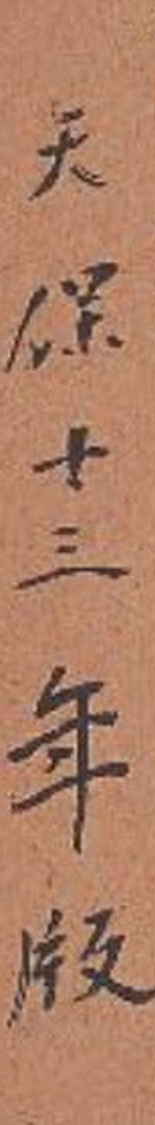天保十三年版

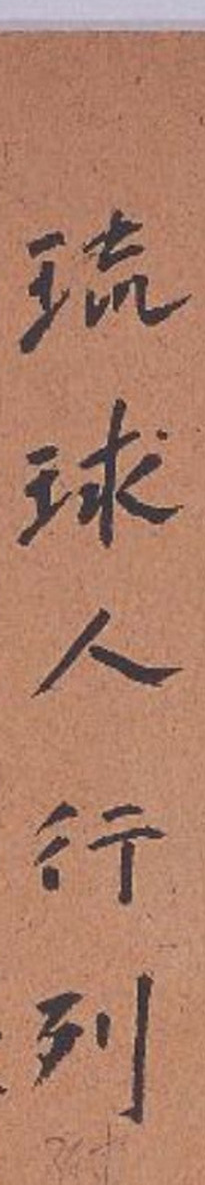琉球人行列
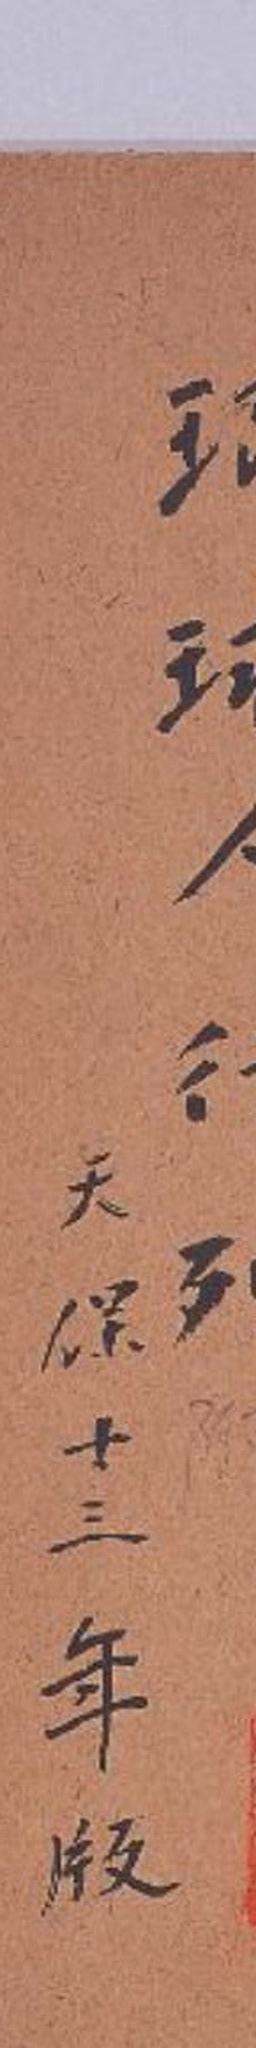天保十三年版
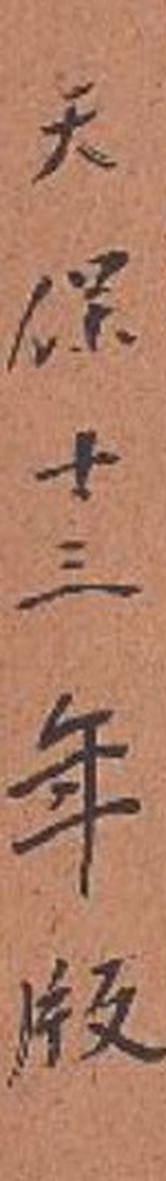天保十三年版

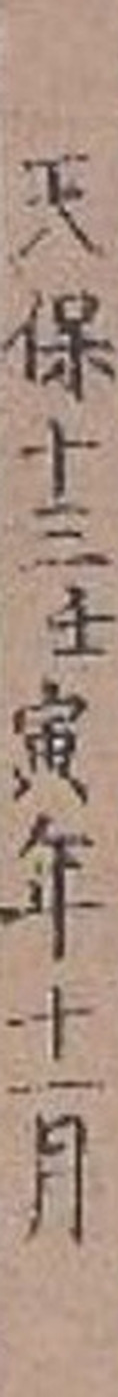天保十三壬寅年十一月
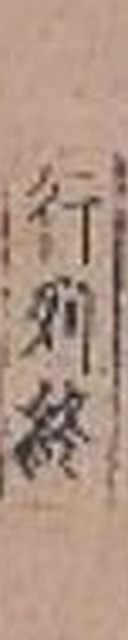行列終
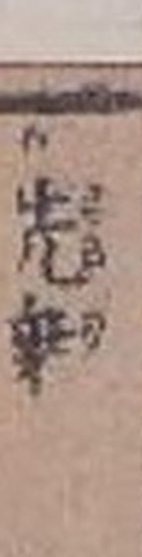○先乗
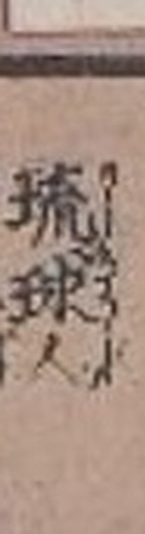琉球人
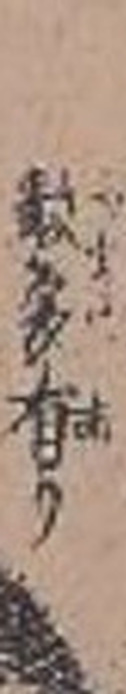数多有り
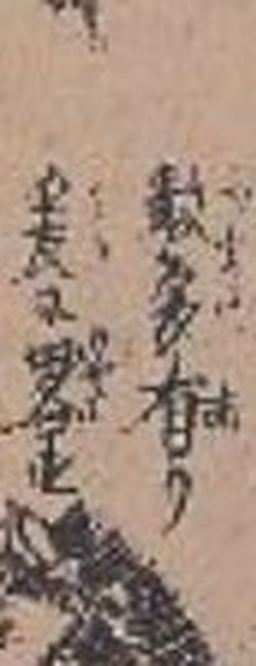爰に略す
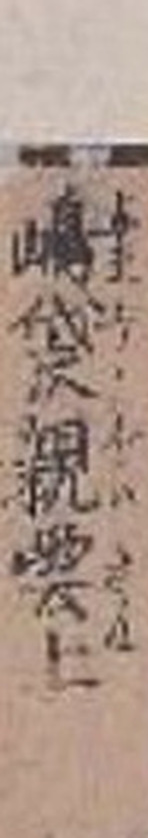嶋袋親雲上
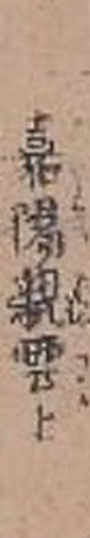嘉陽親雲上
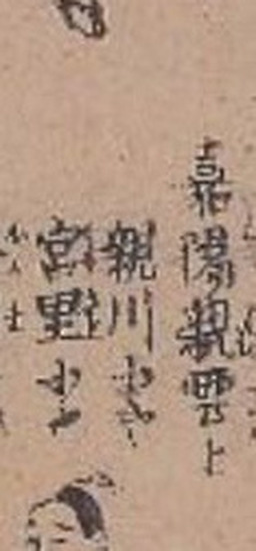親川にや
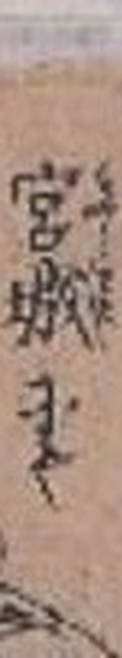宮城にや
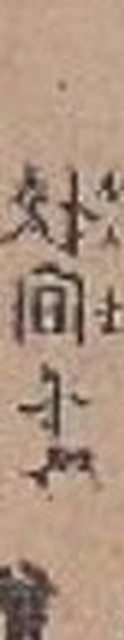外間にや
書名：琉球人行列附 天保十三壬寅年十一月
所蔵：University of the Ryukyus Library
